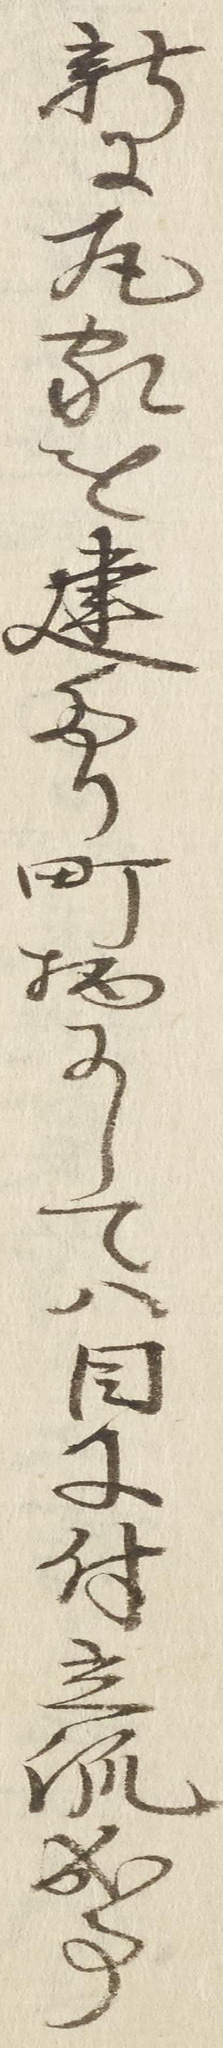新に瓦家を建たり町柄にしては目に付立派成事
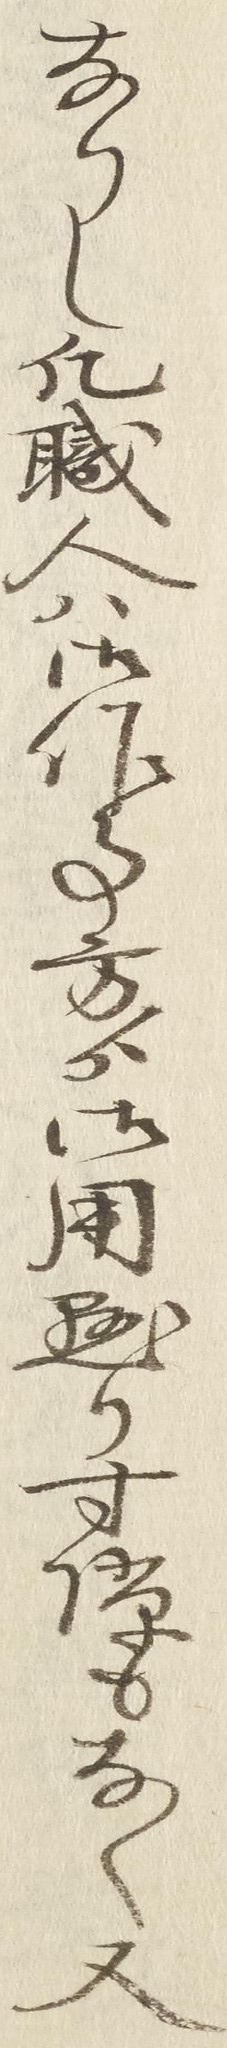なりし凡職人は御作事方より御用懸りす隙もなく又
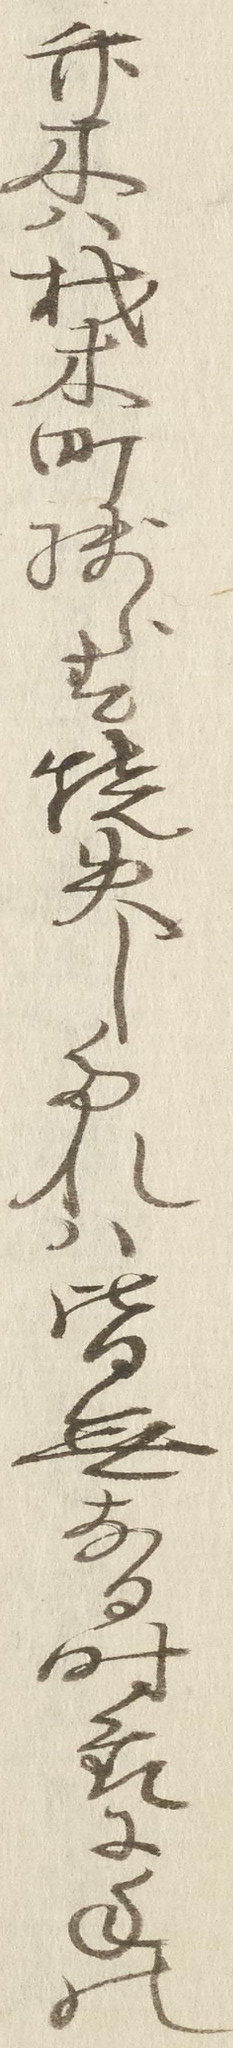竹木は材木町残らす焼失したれは皆無なる時節に手の
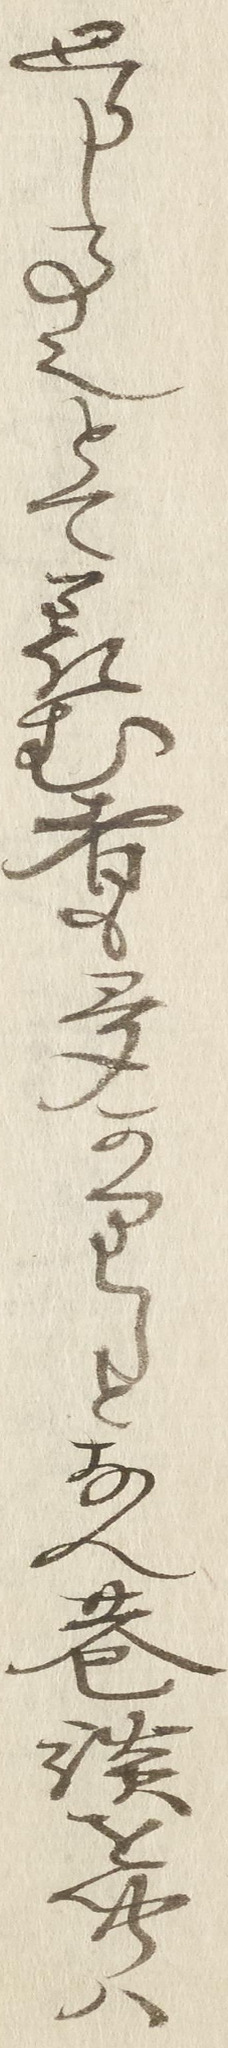廻りし事也とて羨む者も多かりしとなん巷談を聞は
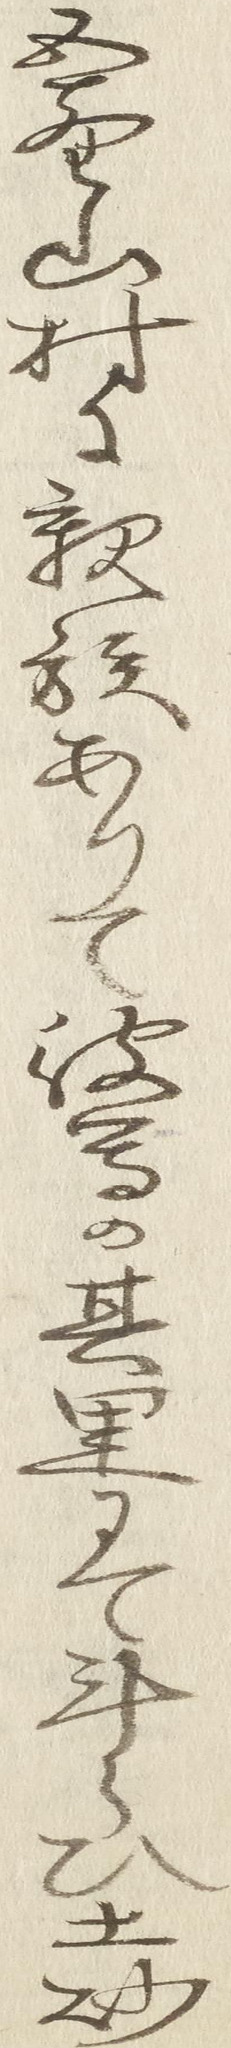五台山村に親族ありて彼等の其里にて計らひ土砂
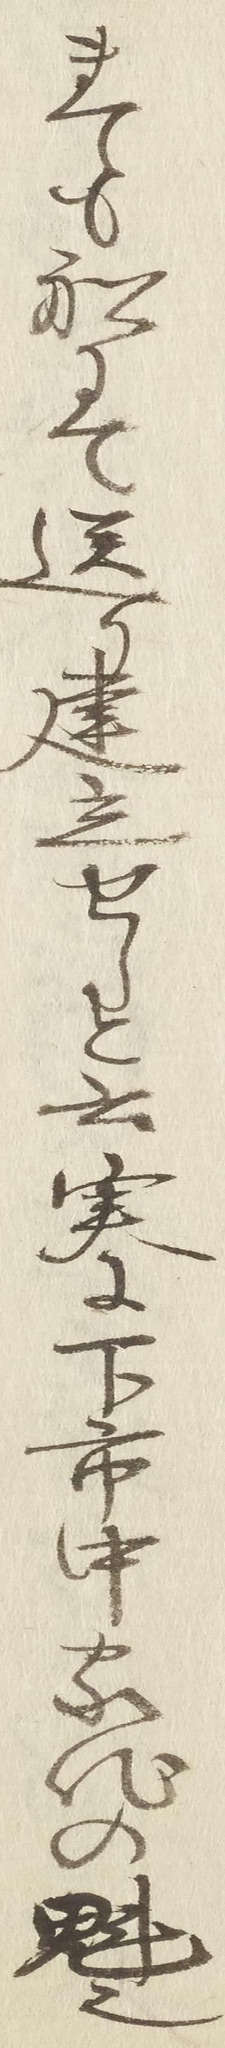まても船にて送り建立せしと云実に下市中家作の魁也
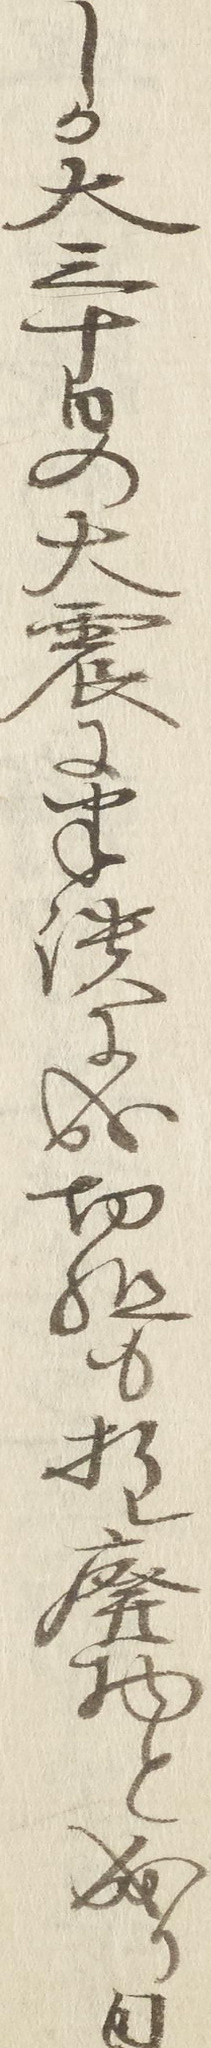しか大三十日の大震に半潰に成切組も折れ廃物と成り日
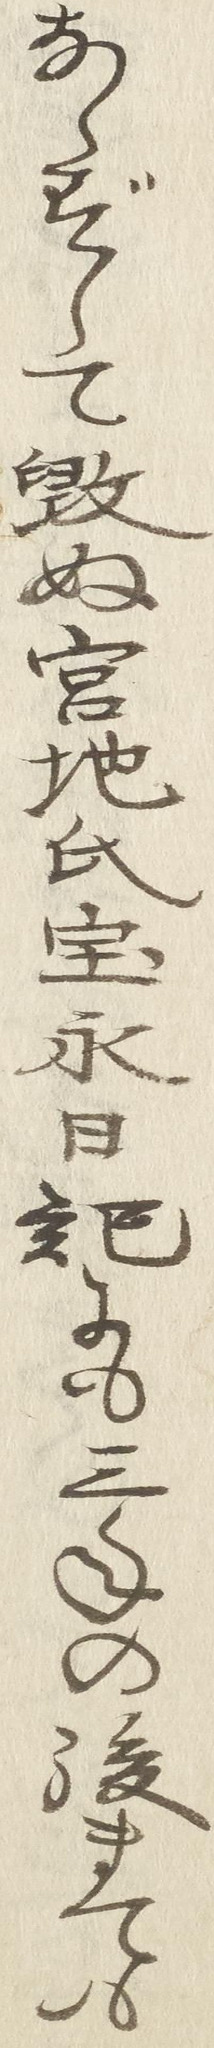ならずして毀ぬ宮地氏宝永日記にも三年の後まても
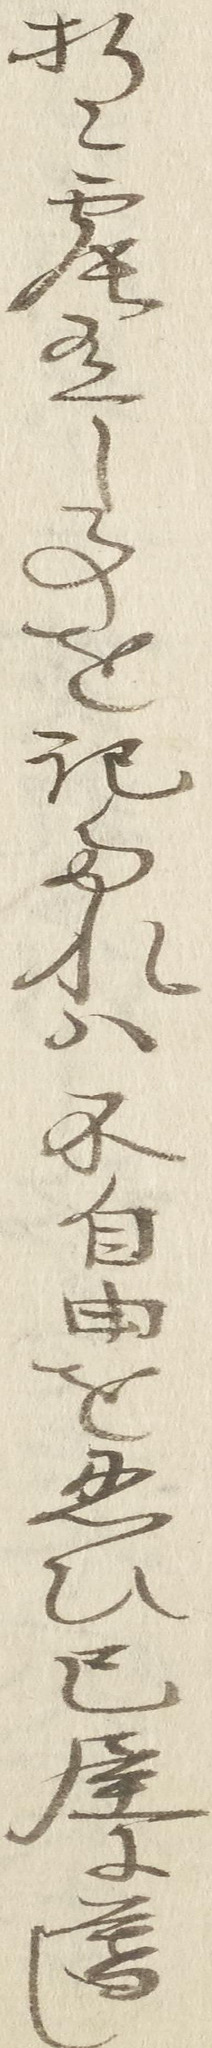折々震有し事を記たれは不自由を忍ひ己屋に暮し
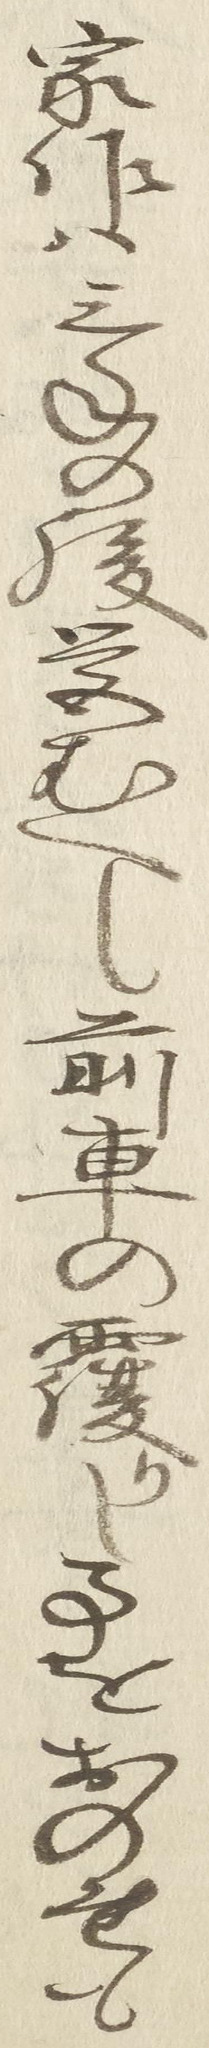家作は三年の後営むへし前車の覆りし事をおのれも
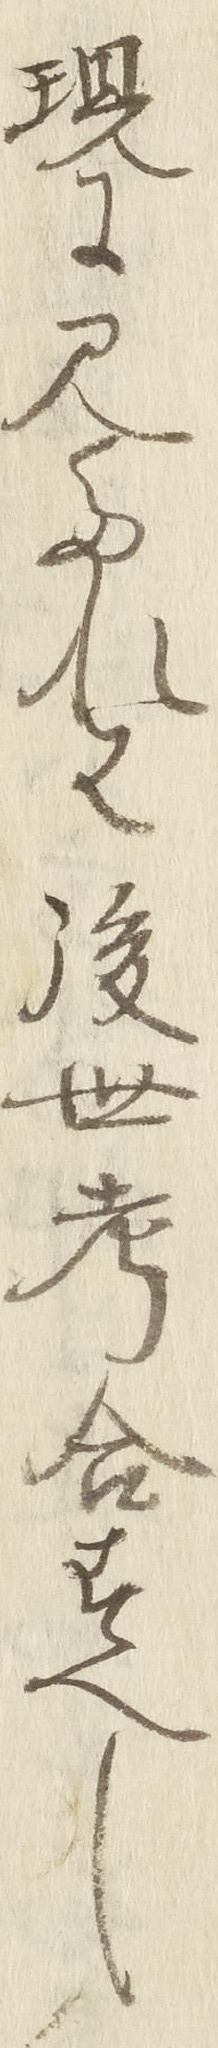現に見たれは後世考合すへし

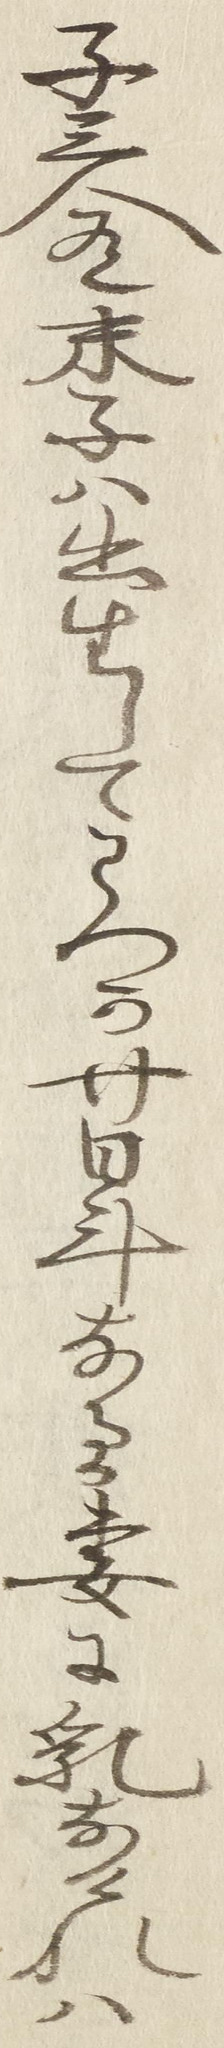子三人有末子は出生してはつか廿日計なるか妻に乳なけれは
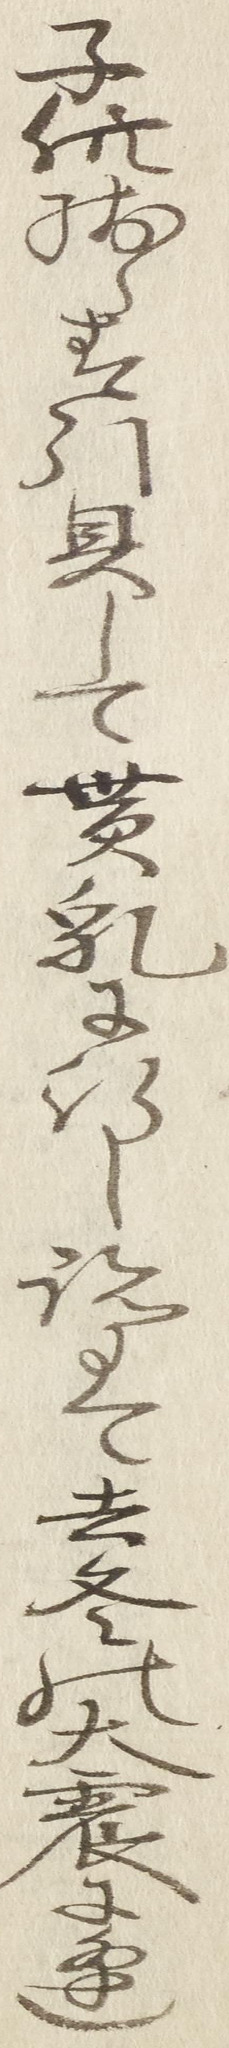子供残らす引具して貰乳に行し諸事今去冬の大震に逢
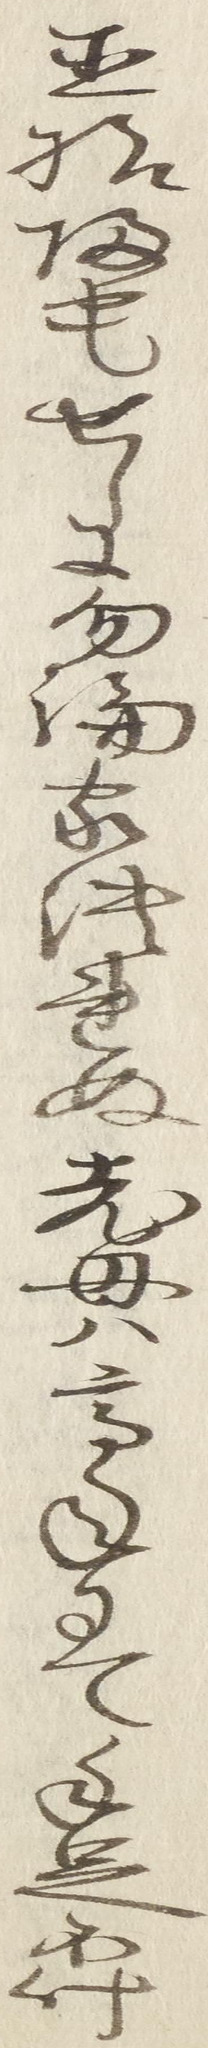直様帰宅もせしに勿論家潰れぬ老母は高年にて手足不叶
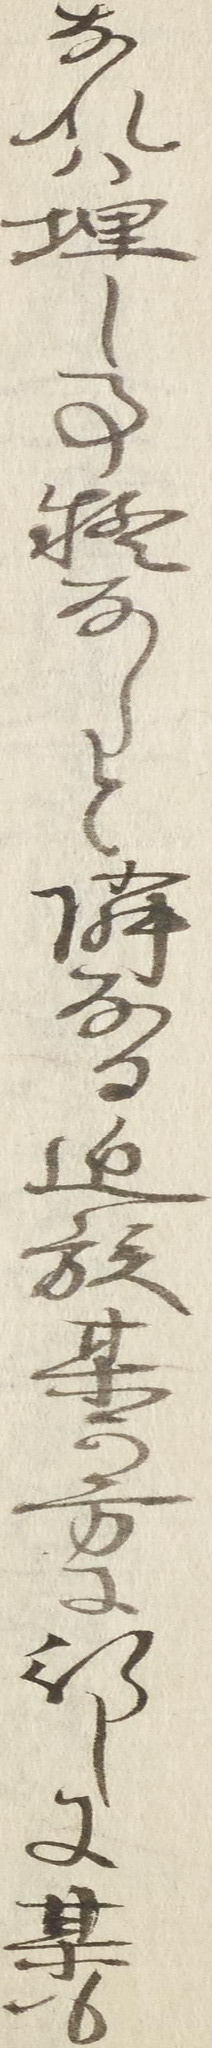なれは埋し事疑なしと隣なる近族某か方に行しに某も
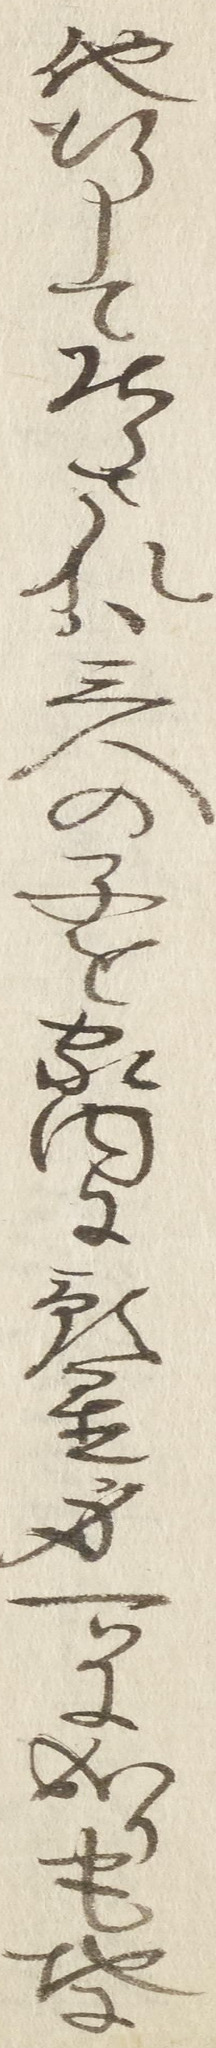他行して居らされは三人の子を家内に預置身一つに成り宅地に
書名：地震記　上
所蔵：東京大学地震研究所図書室 Earthquake Research Institute Library, The University of Tokyo, JAPAN
